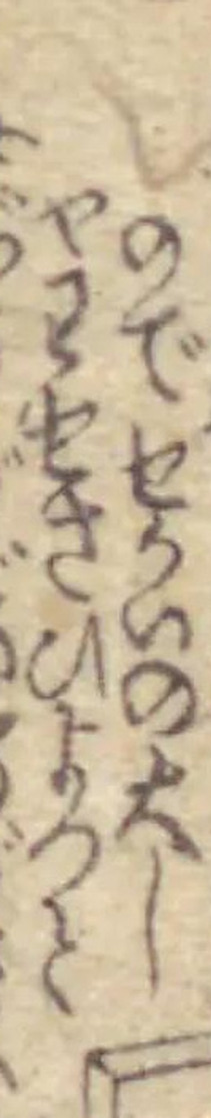やわせさひよつと
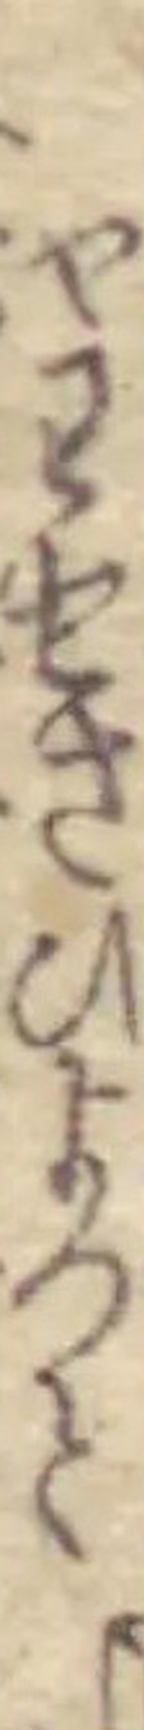やわせさひよつと
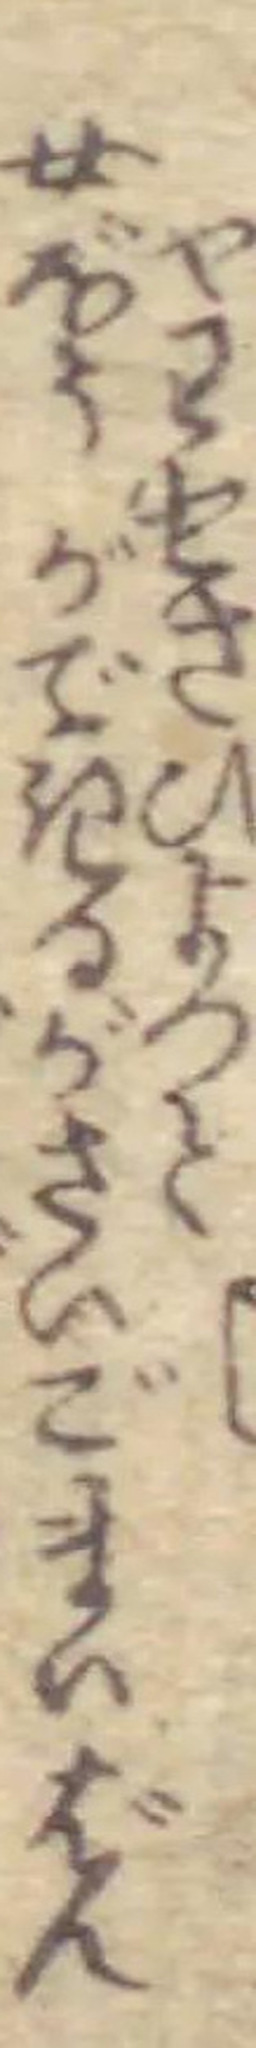女ぼうができるがさいごまいばん
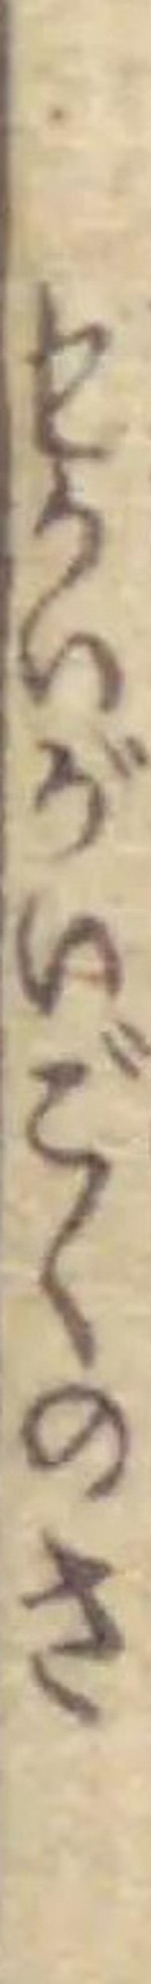せかいがいごくのさ
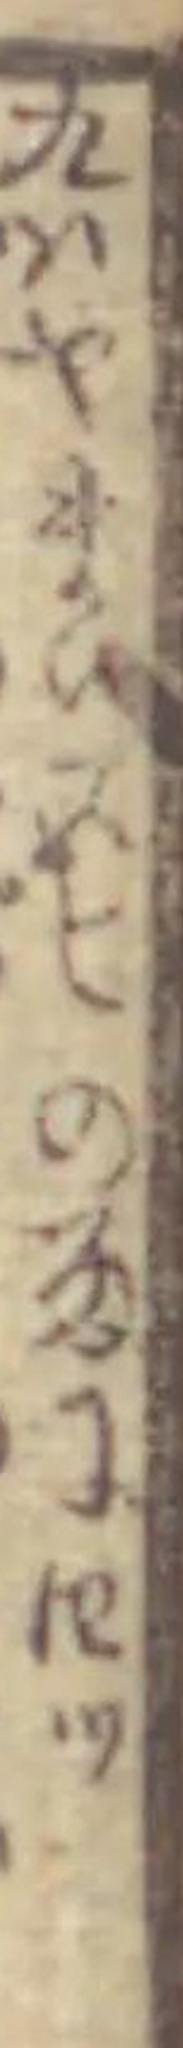九はやまい五七の雨に四つ
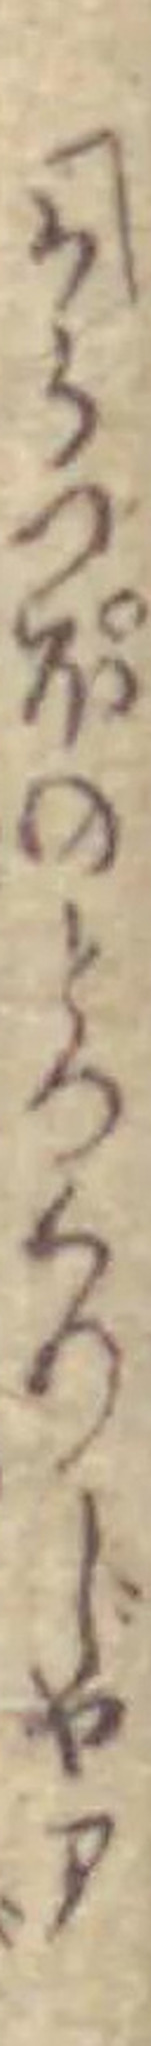〽からつぽのとつくりじやァ
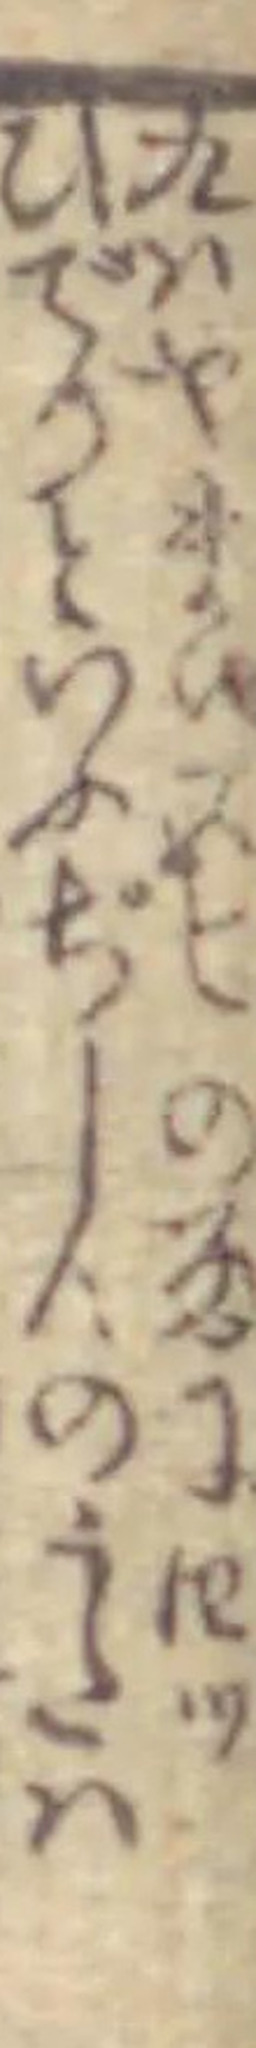ひでりといふぢしんのうたは
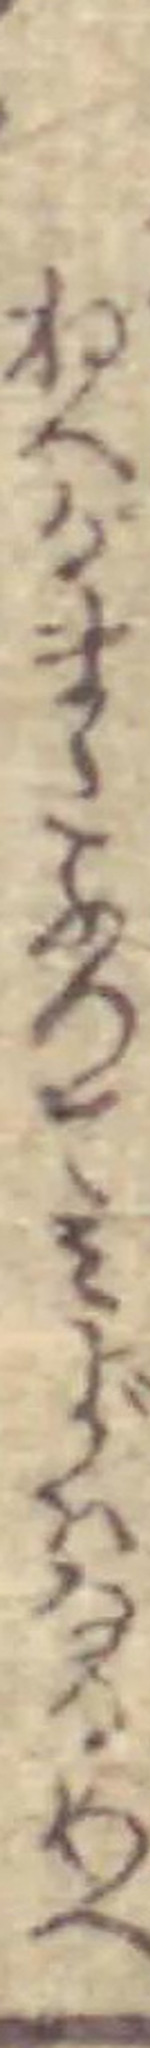ねへがまたふつてみよがはなるめへ
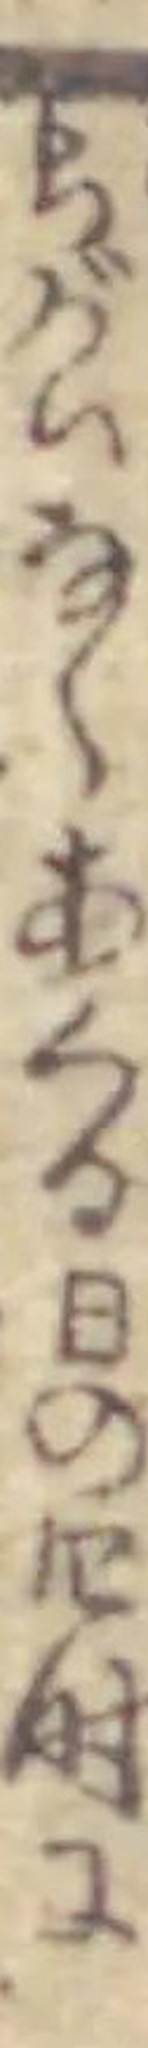ちがいなくあくる日の四時に
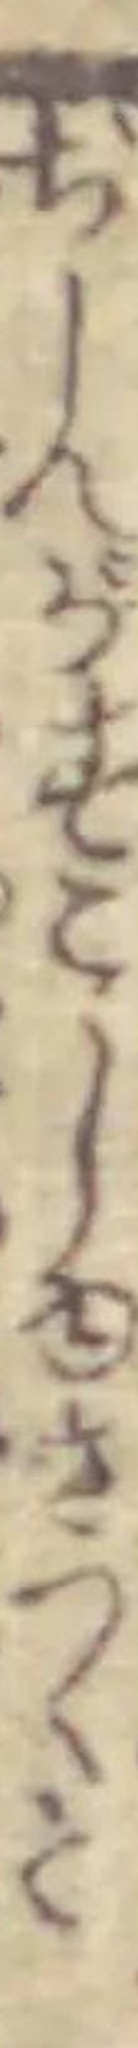ぢしんがすこしゆさつくと
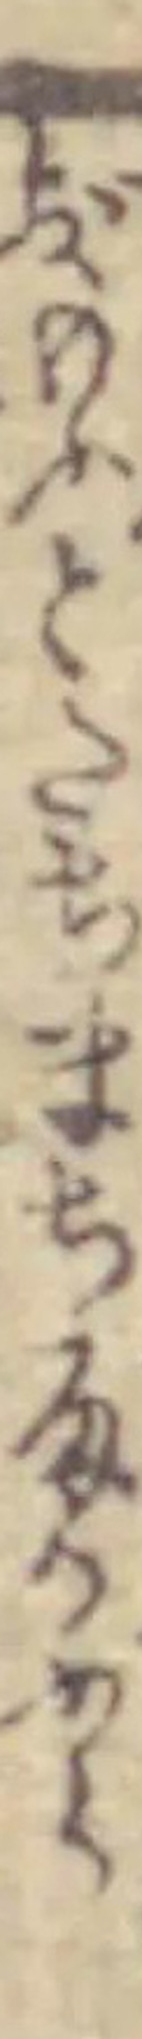おもふとたちまち雨かふら
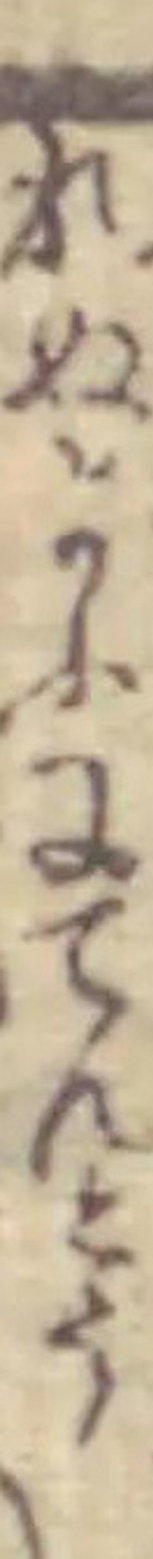れぬよふにてんとう
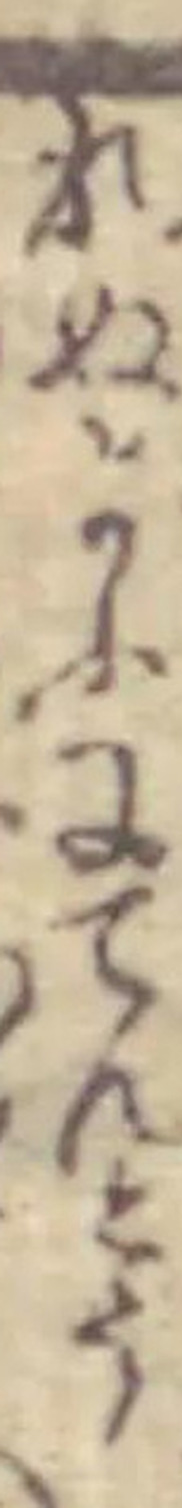れぬよふにてんとう
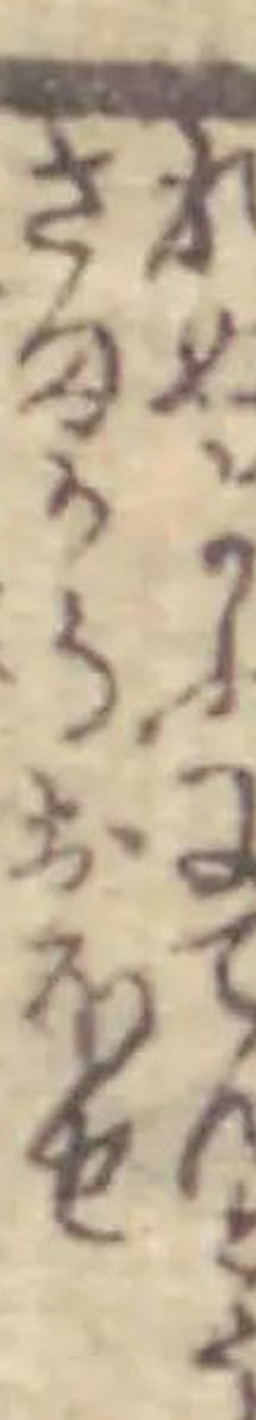さまからおほせ
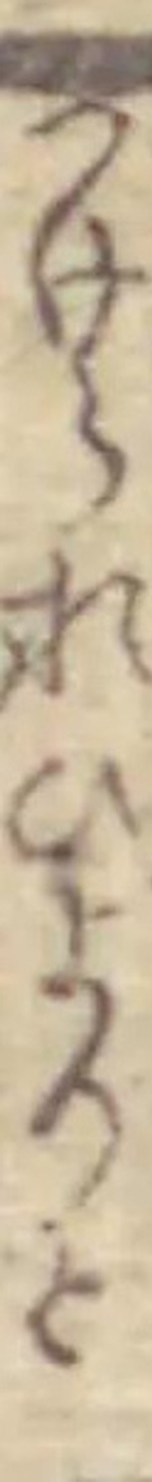つけられひよりと
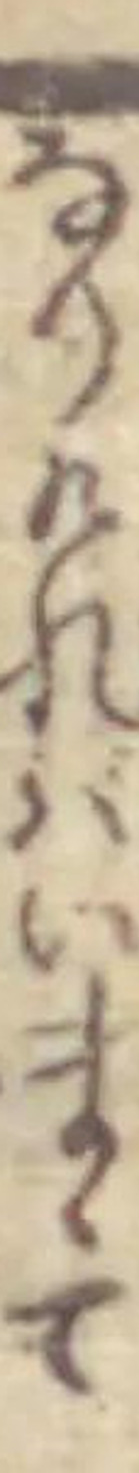なりければいまゝて
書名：雨宮風宮出儘略縁記 3巻
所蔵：国立国会図書館 National Diet Library, JAPAN
